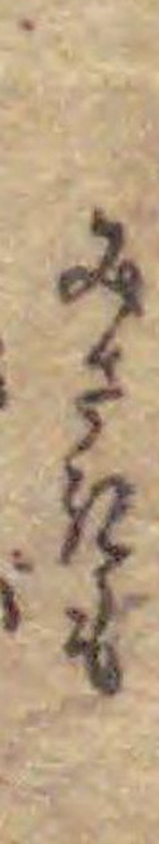みさきも
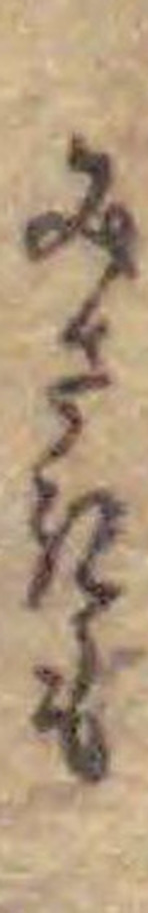みさきも

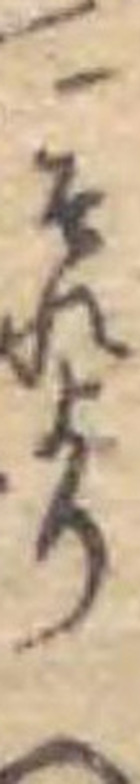それより
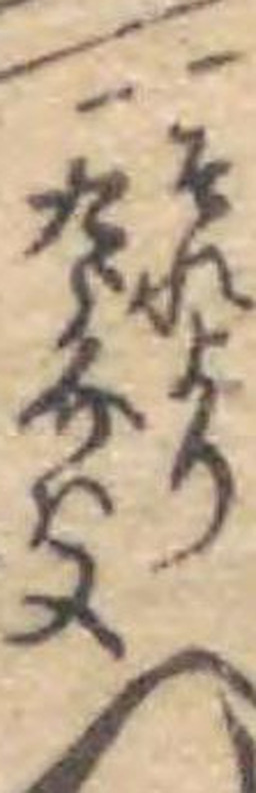九郎介は又
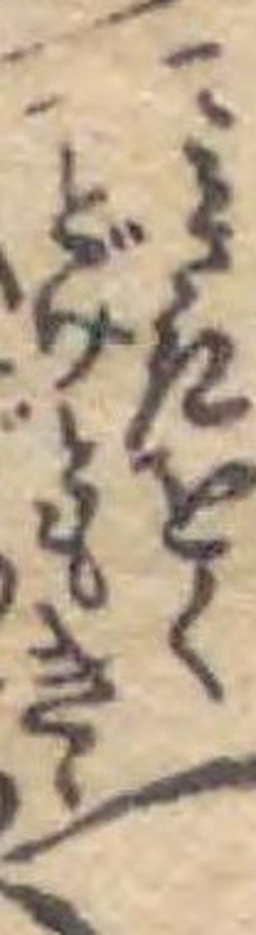どけともきゝ
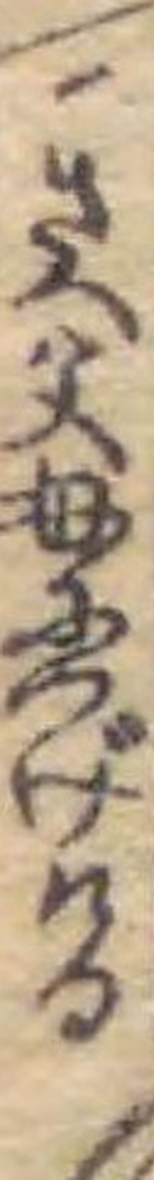さへ父母につげける
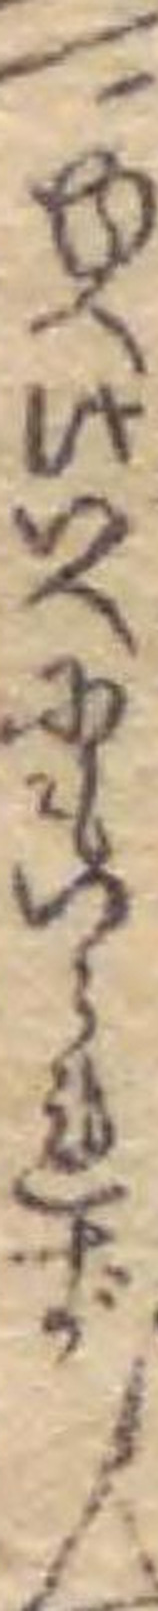ゆへ此いへにもいられず
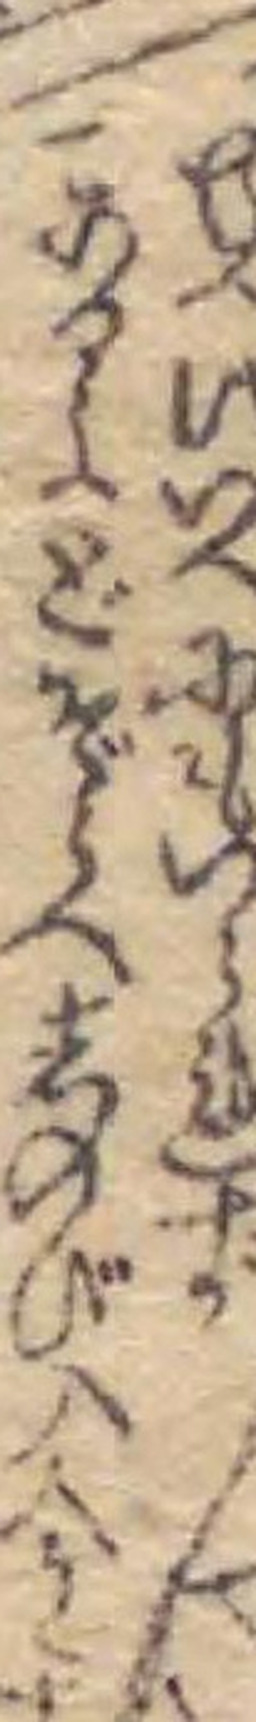あるよどぞうへしのび入金す
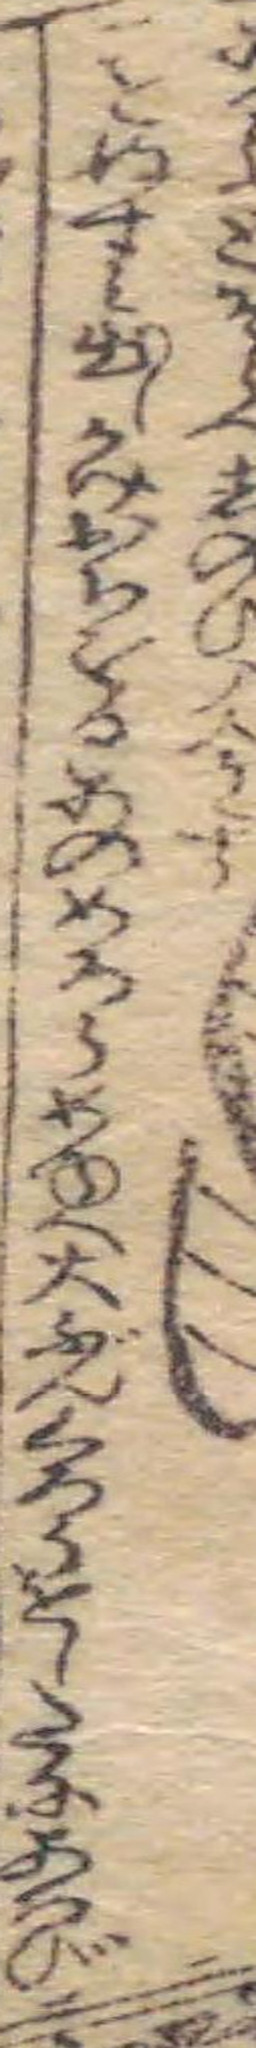をぬすみ出しかけおちするあのめろうめゆへ大ぶんくろうをしたにあはび
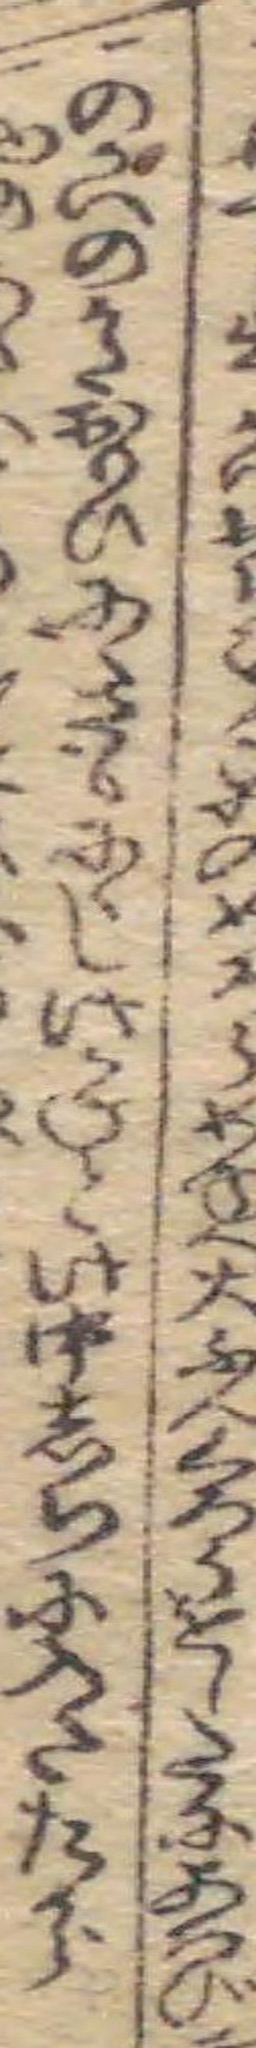のかいのかたおもひにくさもにくし此かねと此中しちに入たたから
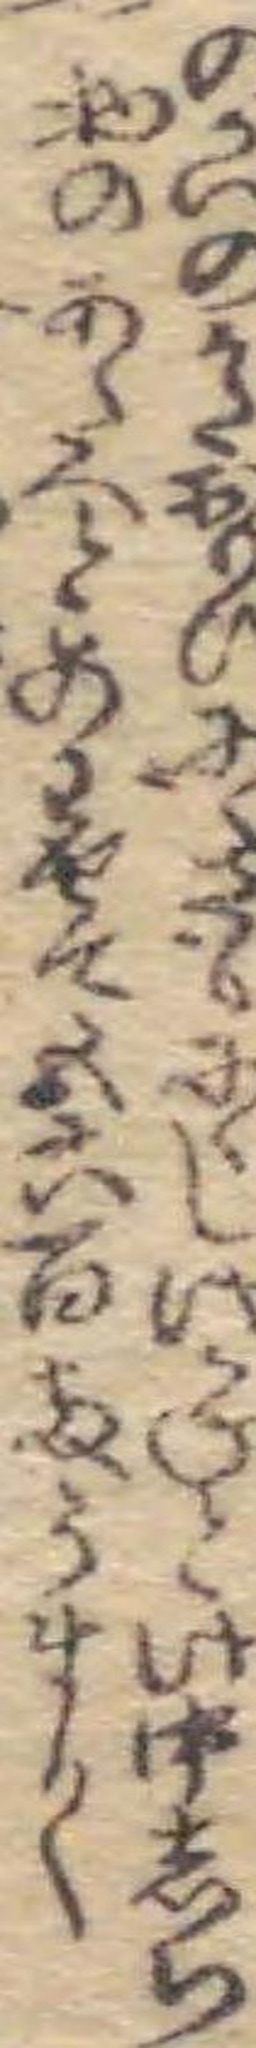物のあたへとあわせて五六百両うま
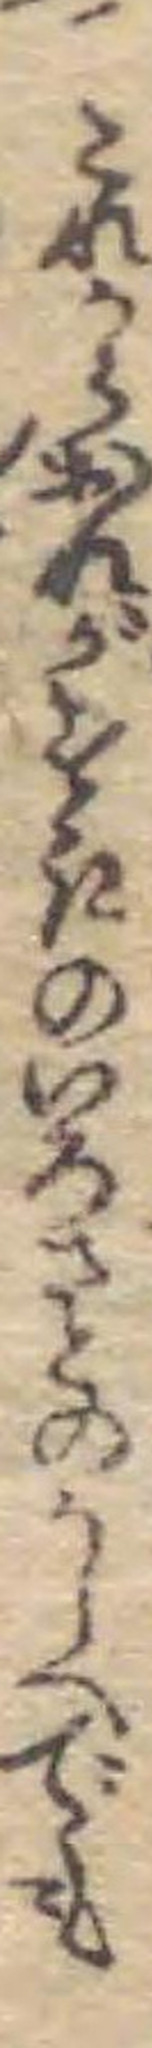これからおれがすきのいろさとのうらへでも
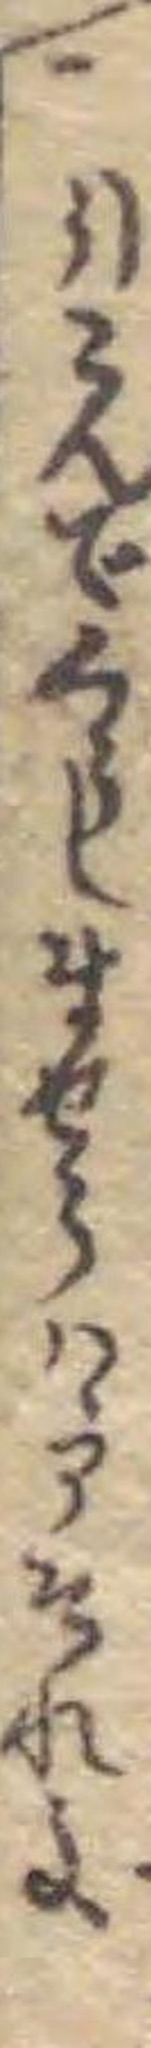引こんでくらしませうハヽアそれよ
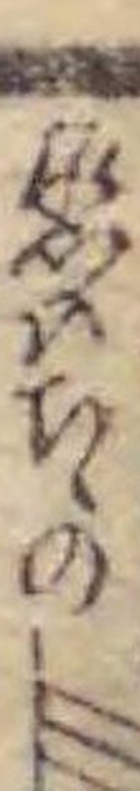丞はちゝの
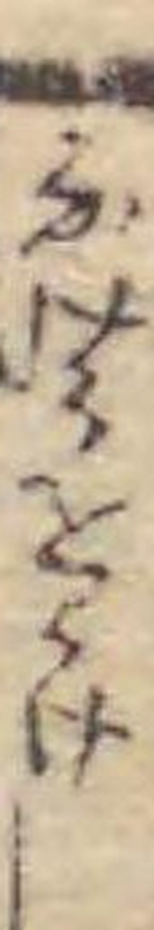ふけうをうけ
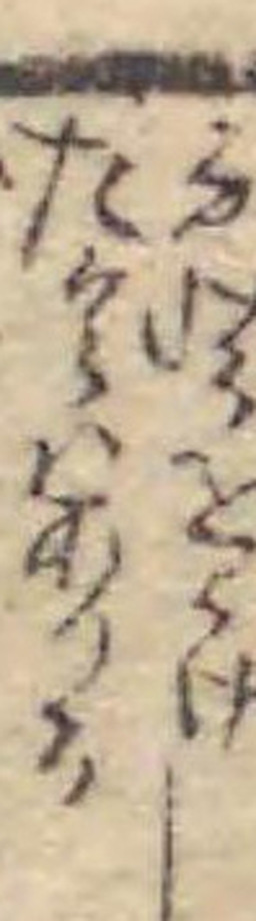たからはありか
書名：扨化狐通人 : 2巻
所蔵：国立国会図書館 National Diet Library, JAPAN
